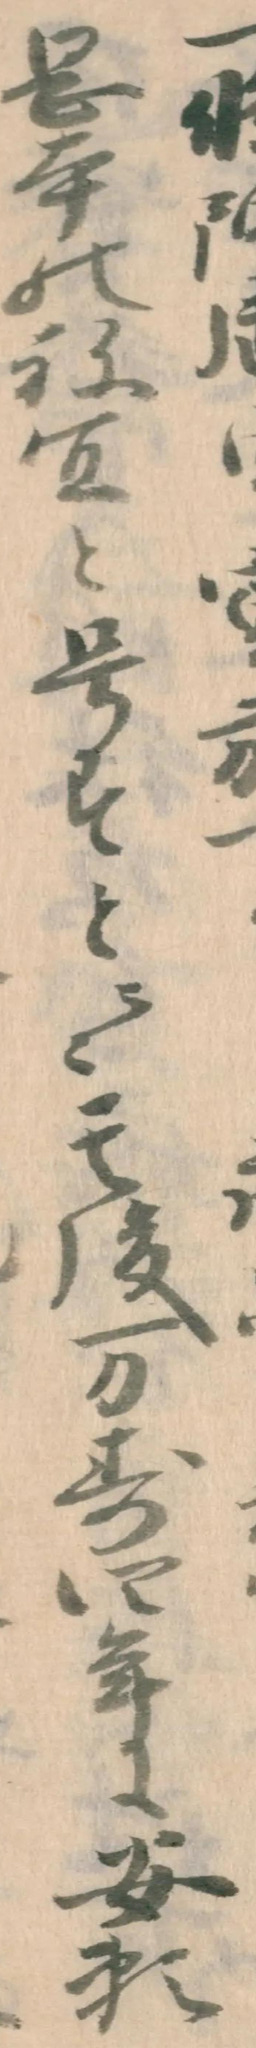岡本の祢宜と号すと云々其後万寿四年に安頼
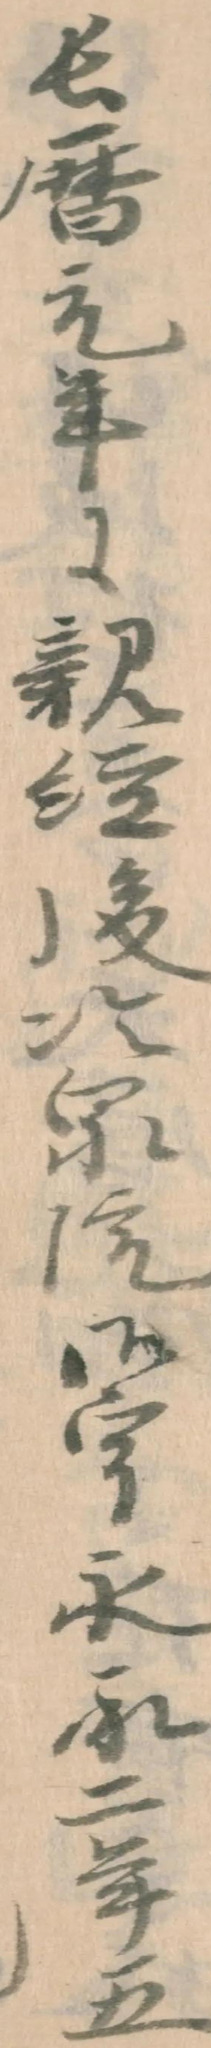長暦元年に親経後冷泉院御宇永承二年五
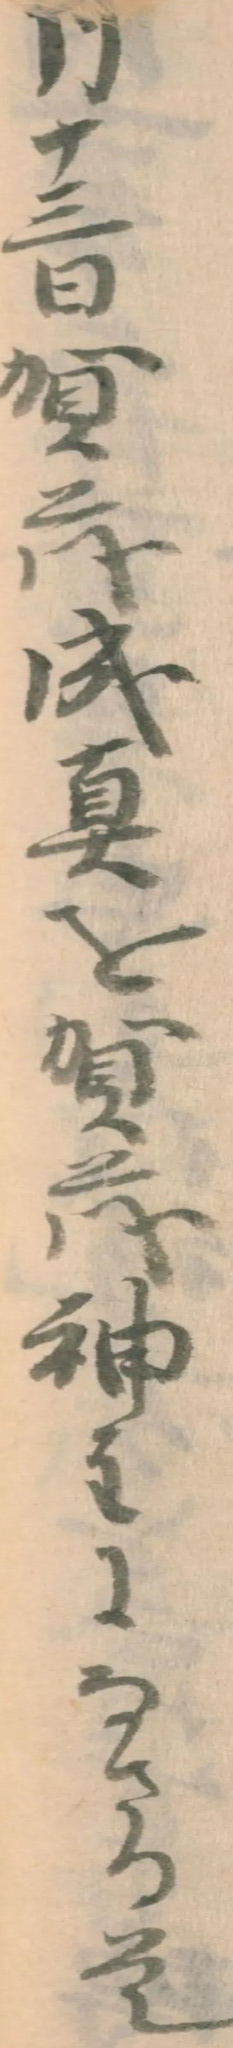月十三日賀茂成真を賀茂神主になさる是
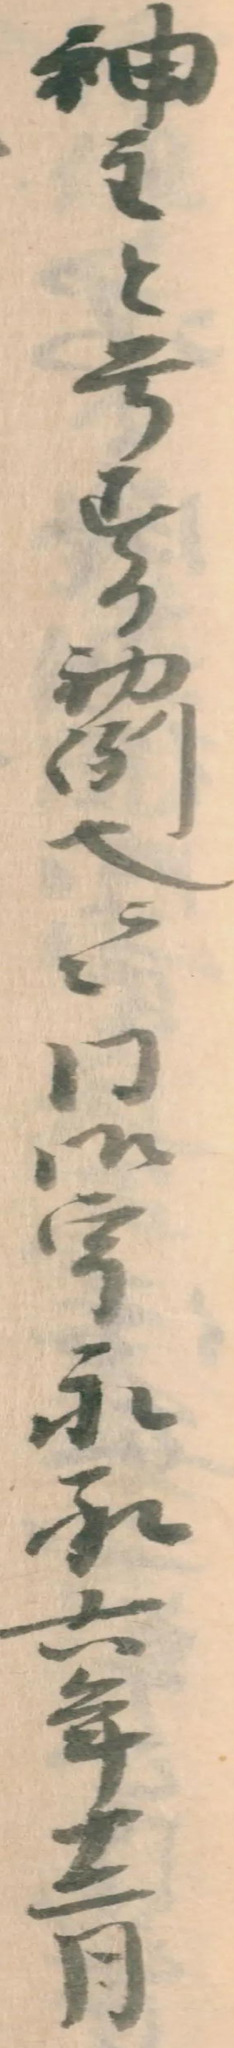神主と号する初例也云々同御宇永承六年十二月
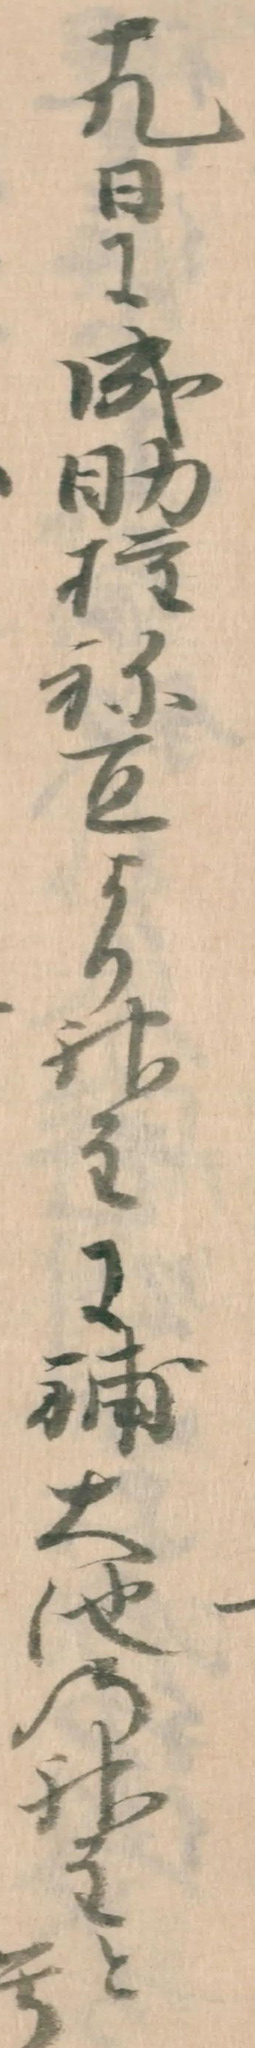十九日に成助権祢宜より神主に補大池の神主と号
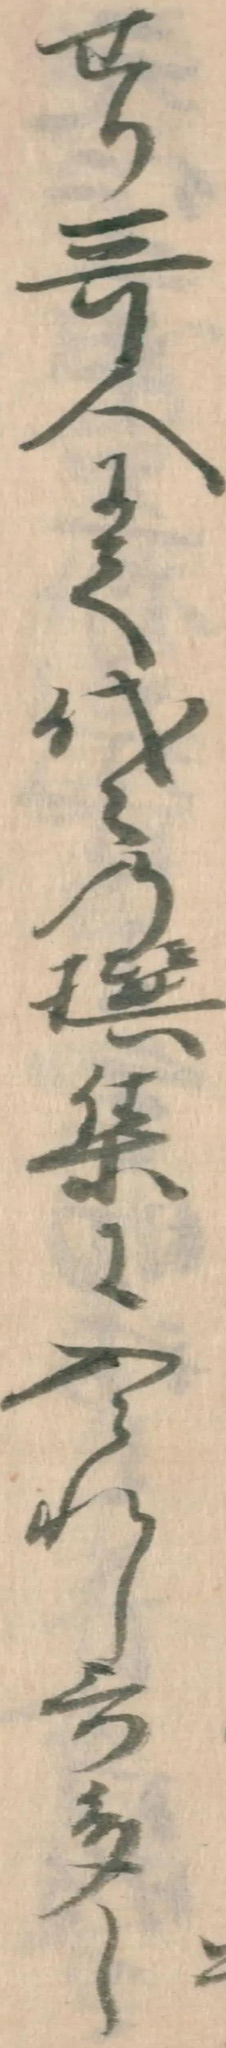せり哥人にて代々の撰集に入られし哥多し
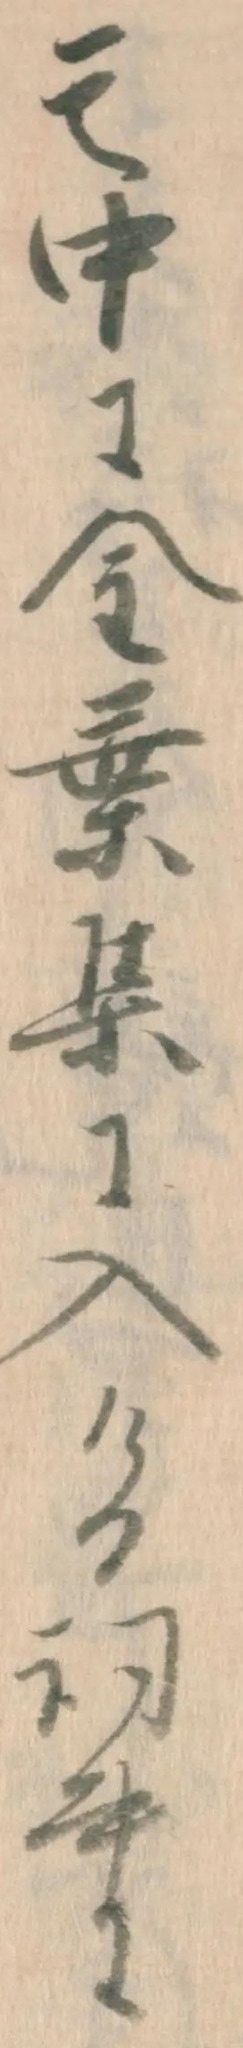其中に金葉集に入ける詞書に
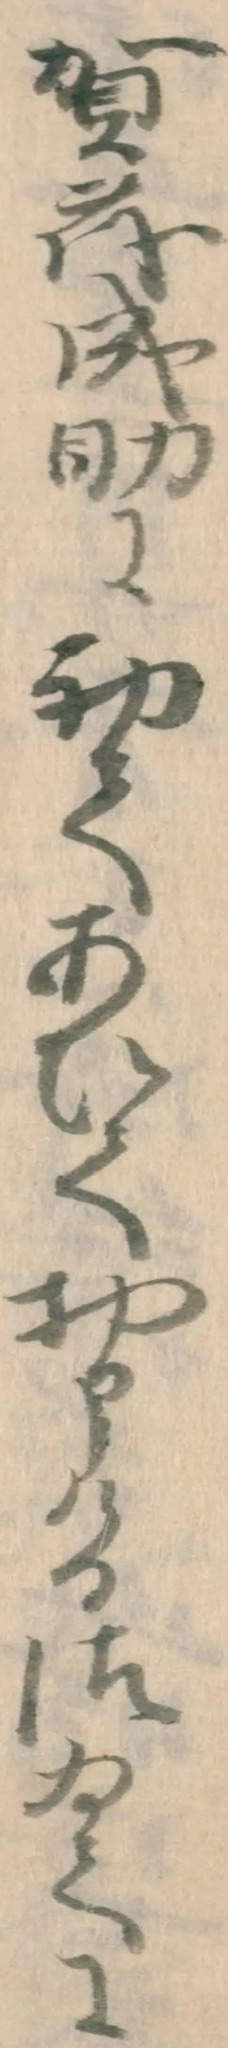賀茂成助に初てあひて物申けるつゐてに
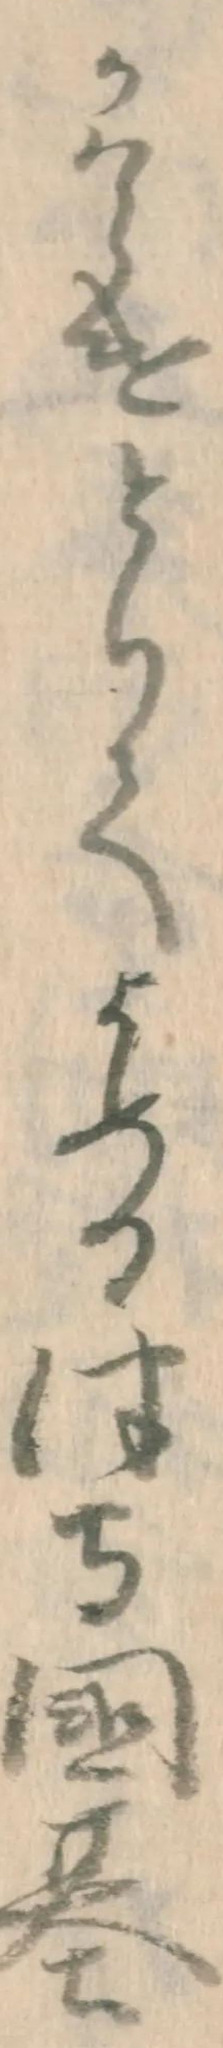かはらけとりてよめる津守国基
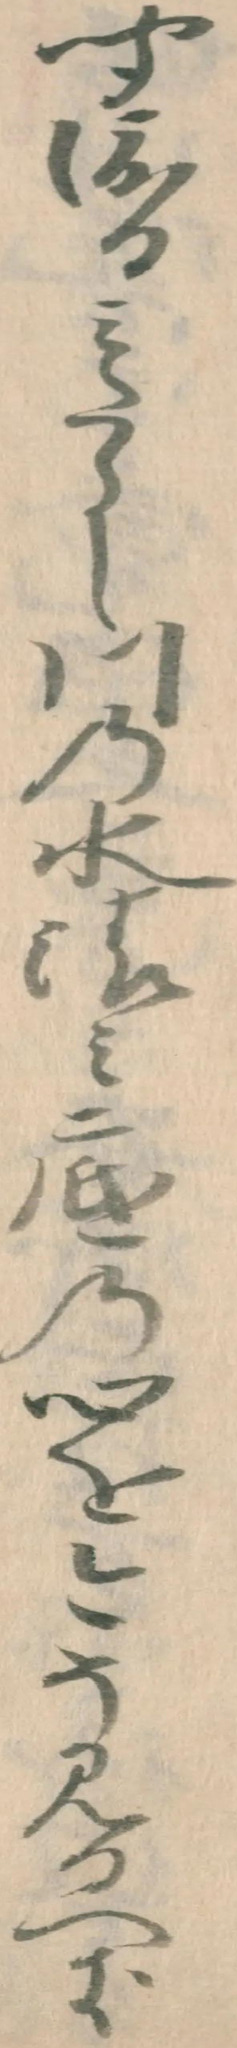聞渡るみたらし川の水清み底の心を今そ見るへき
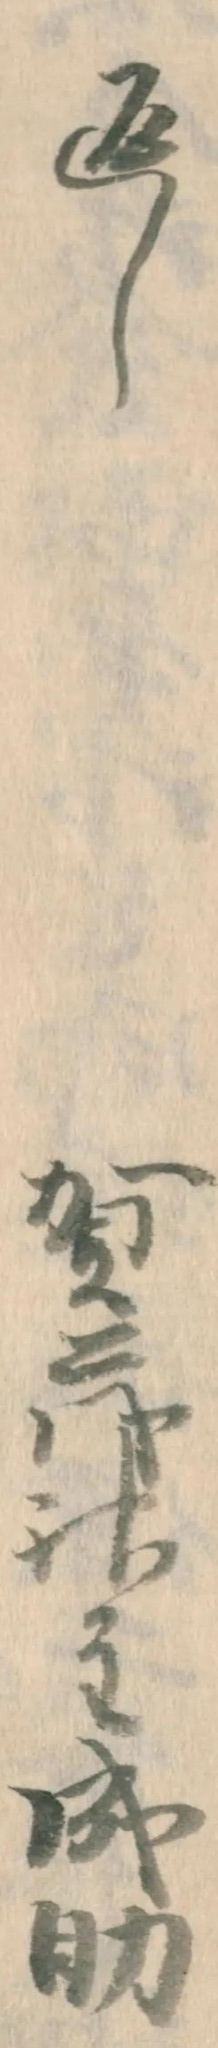返し賀茂神主成助
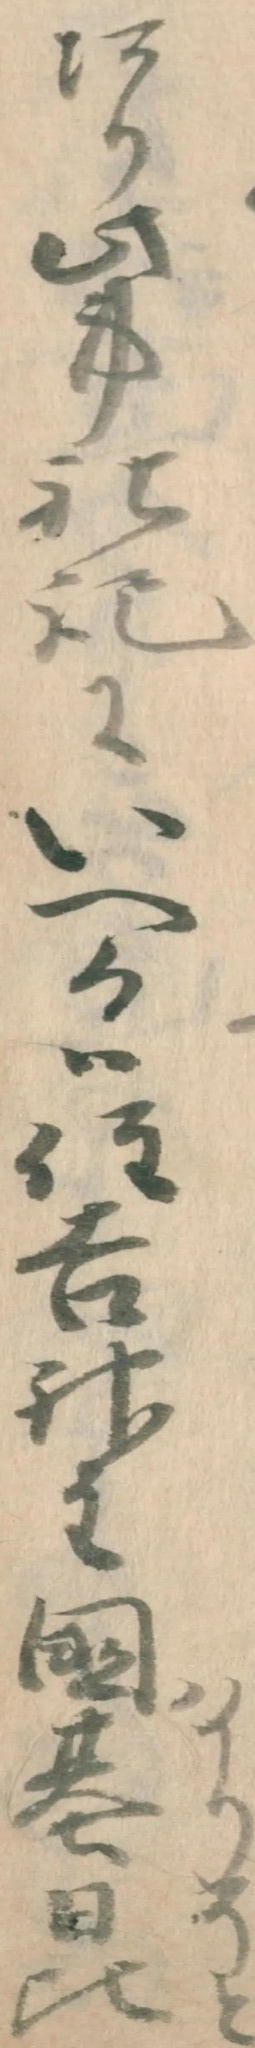あり此事社記にいへるは住吉神主国基日比

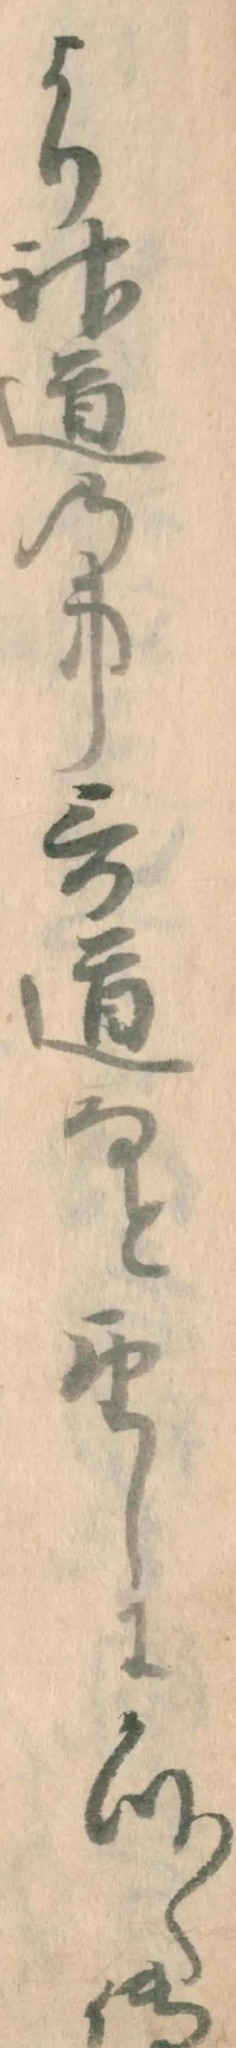より神道の事哥道なと望しにかつ〳〵伝
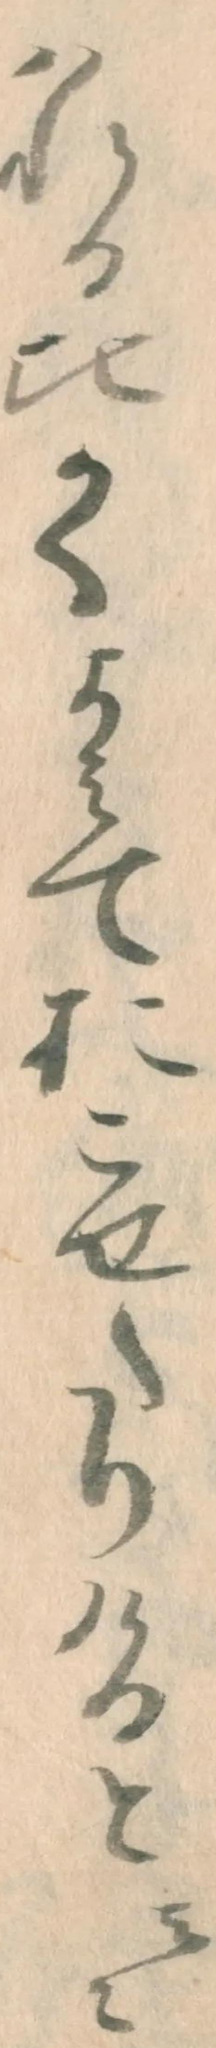はれる比かくよみておこせたりけると云々
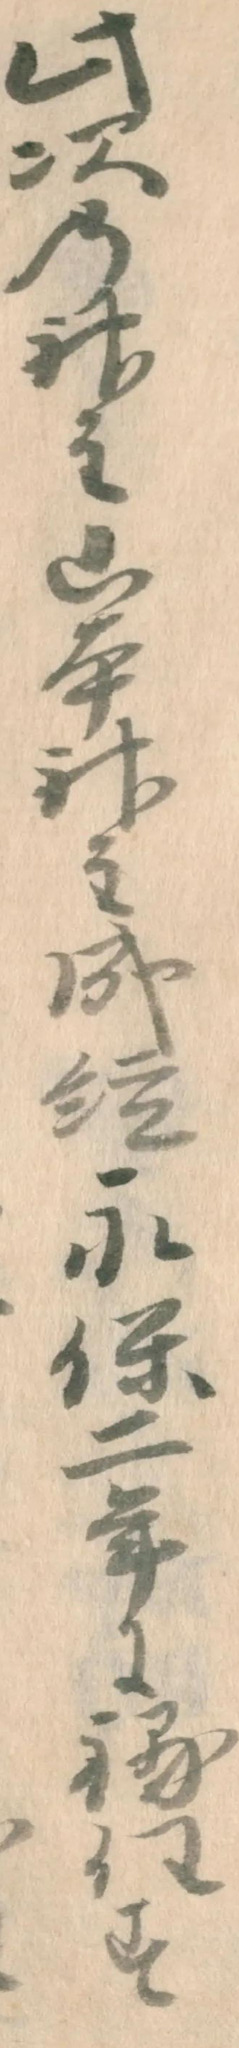此次の神主山本神主成経永保二年に補任す
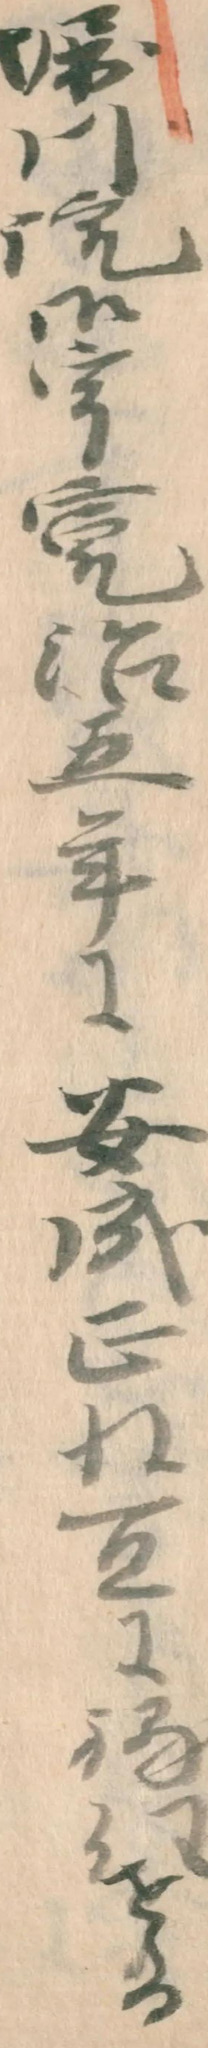堀川院御宇寛治五年に安成正ね宜に補任せらる
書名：賀茂社記録. 第1冊
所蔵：国立国会図書館 National Diet Library, JAPAN
